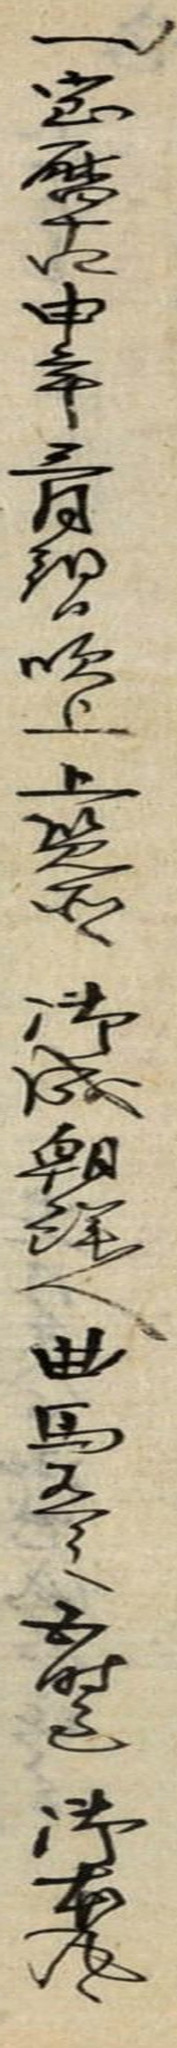一宝暦十四申年三月朔日吹上上覧所へ御成朝鮮人曲馬有之五時過御本丸へ
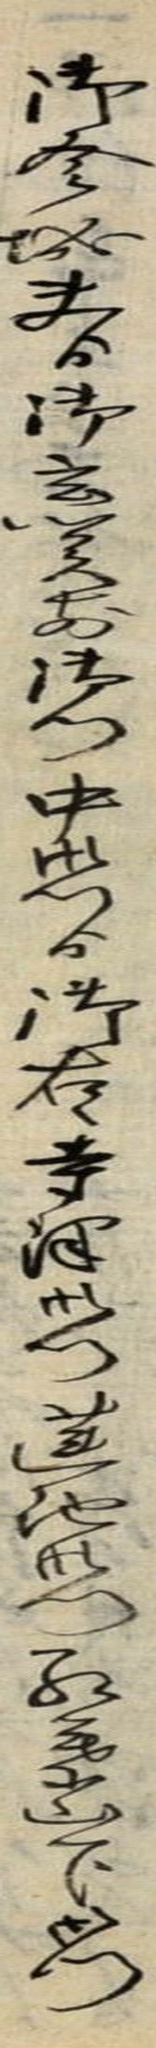御登城夫ゟ御玄関前御門中御門ゟ御右へ寺沢御門蓮池御門紅葉山下御門
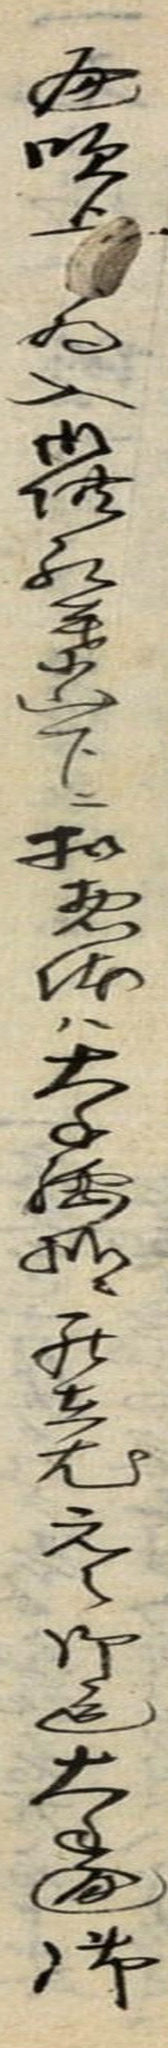通吹上被為入御供紅葉山下に扣惣体は大手腰掛に罷在尤元之御道大手通御
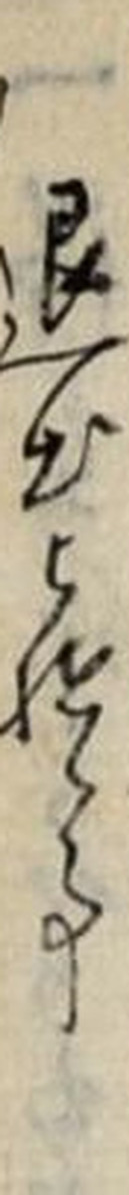退出被遊候事
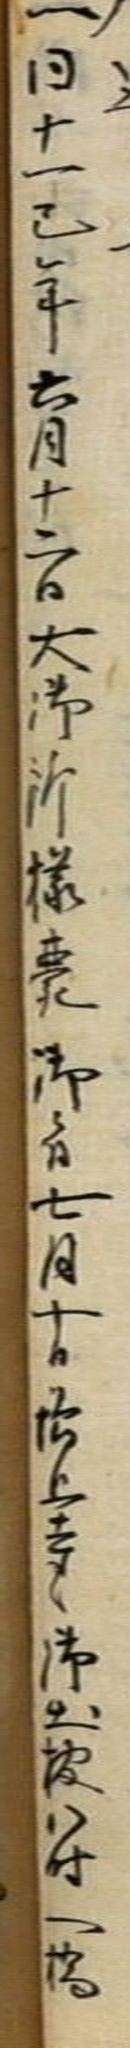一同十一巳年六月十二日大御所様薨御に付七月十日増上寺へ御出棺八時一橋
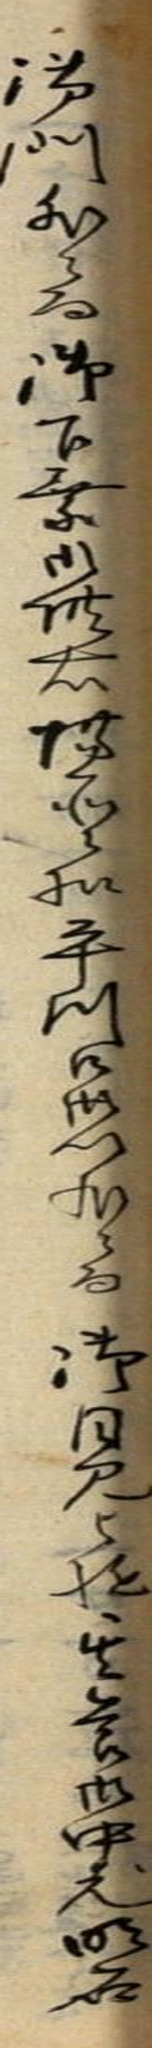御門外にて御下乗御供右場所へ扣平川口御門外にて御目見被遊其節御中老明石
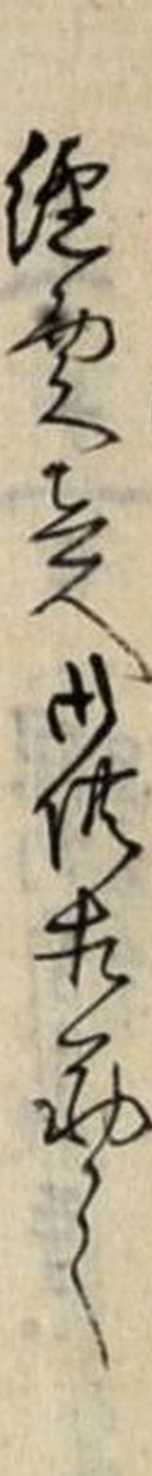経殿壱人御供相勤之
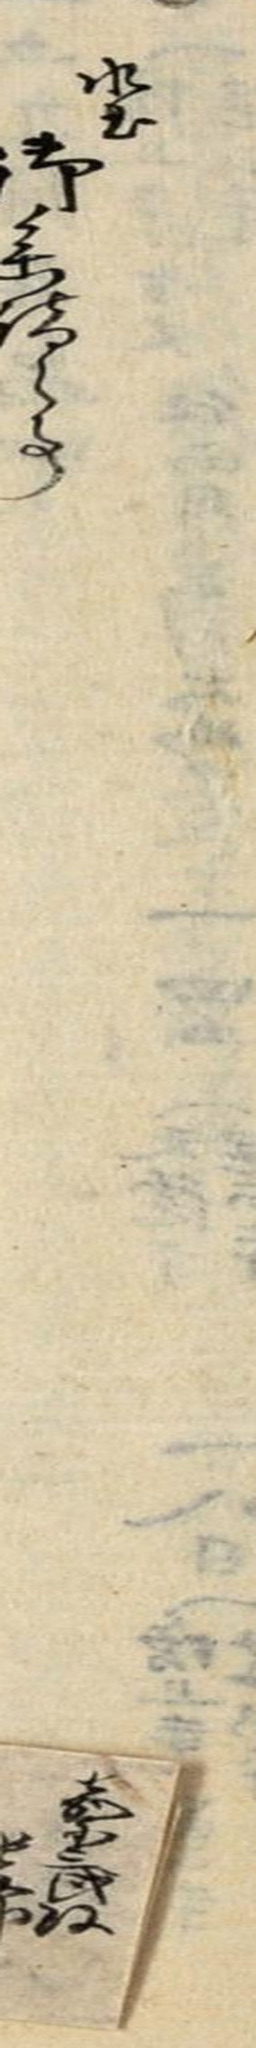御参詣之事
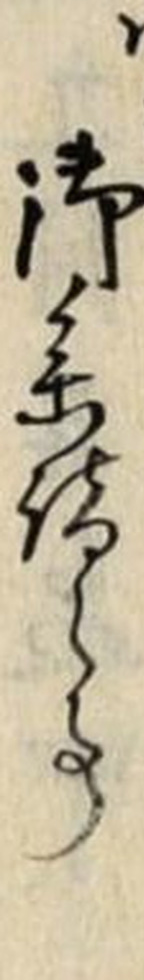御参詣之事
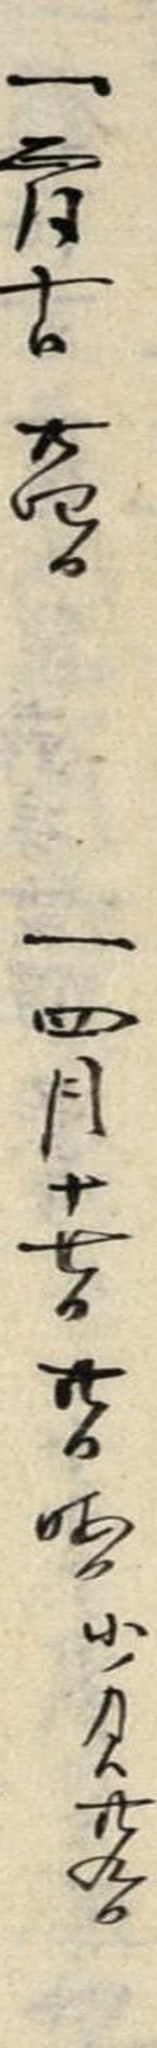一正月十日廿四日一四月十七日廿日晦日小の月は廿九日
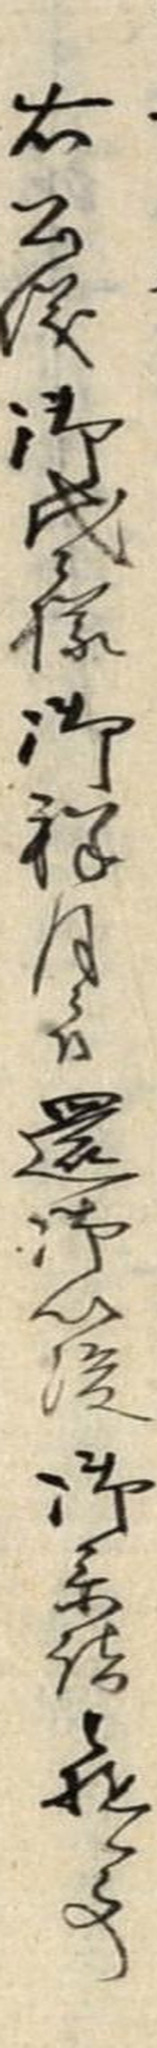右公儀御代々様御祥月に付還御以後御参詣被遊候事
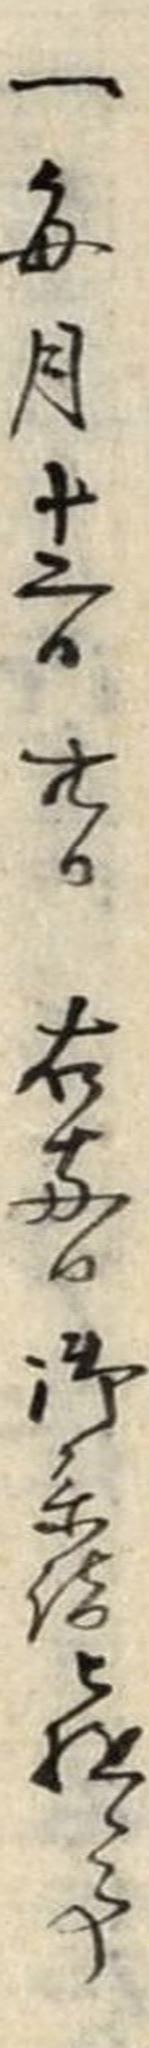一毎月十二日廿日右両日御参詣被遊候事
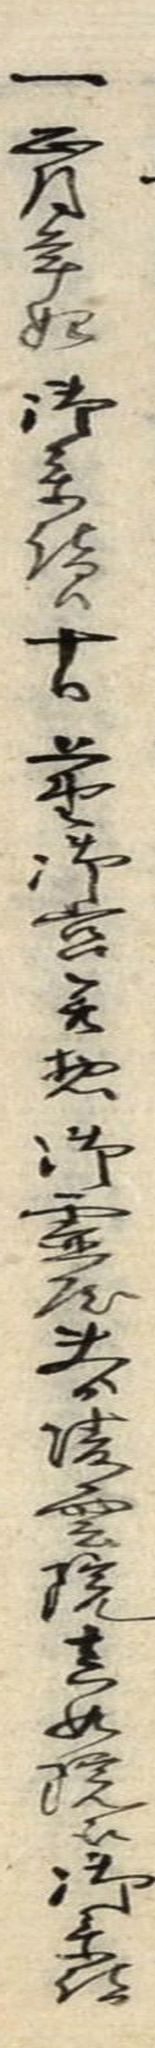一正月年始御参詣は十日上野御宮并惣御霊屋夫ゟ陵雲院真如院江御参詣
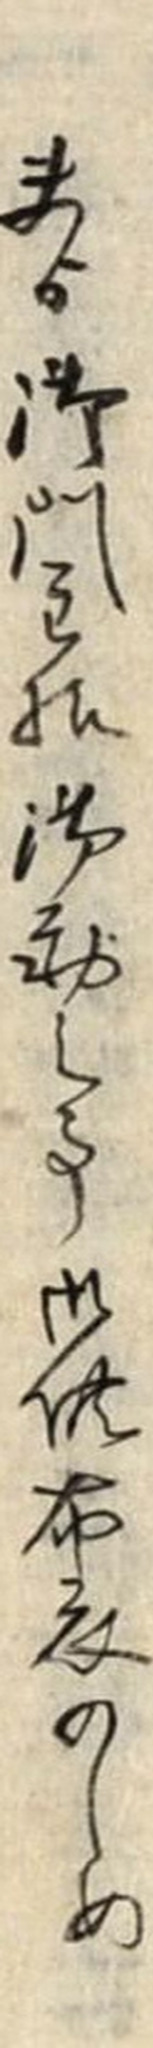夫ゟ御門主様御勤之事御供布衣のしめ
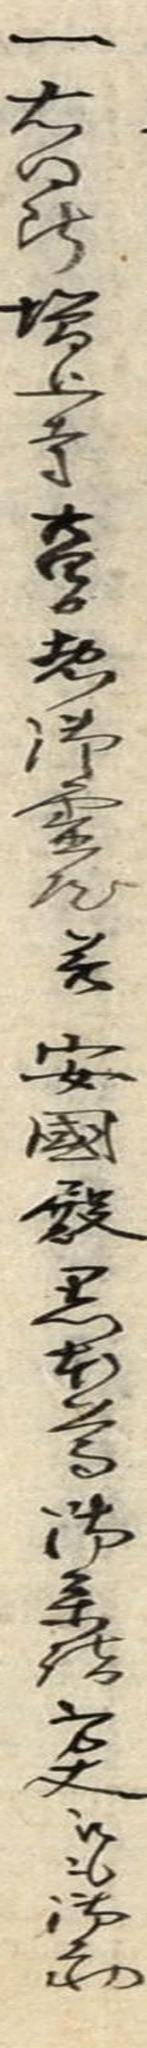一右同断増上寺廿四日惣御霊屋并安国殿黒本尊御参詣方丈江も御勤
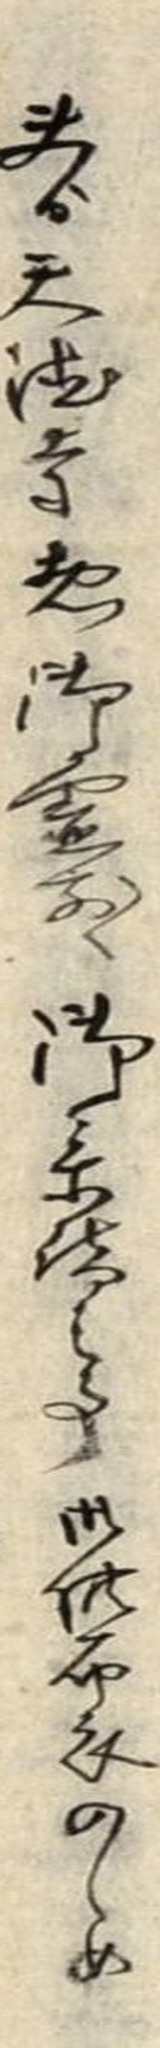夫ゟ天徳寺惣御霊前へ御参詣之事御供布衣のしめ
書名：三都并道中之部
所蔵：福井県文書館 Fukui Prefectural Archives
